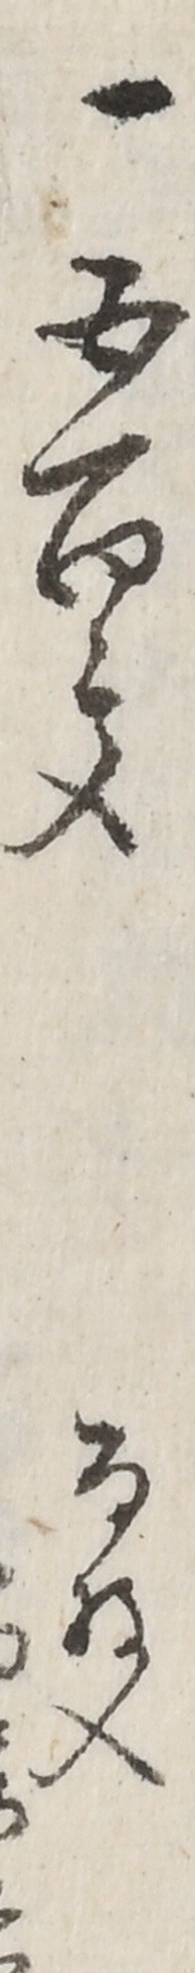一五百文百枚入
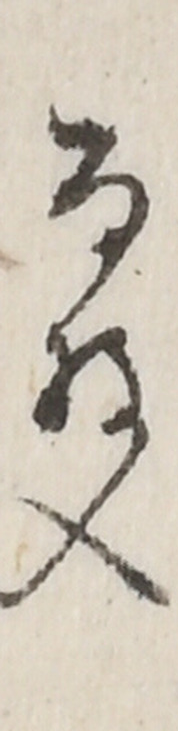百枚入
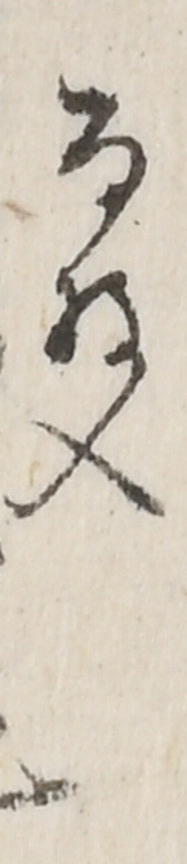百枚入
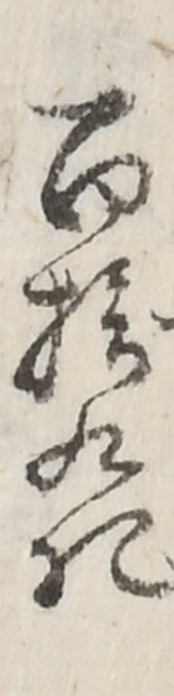百拾九把
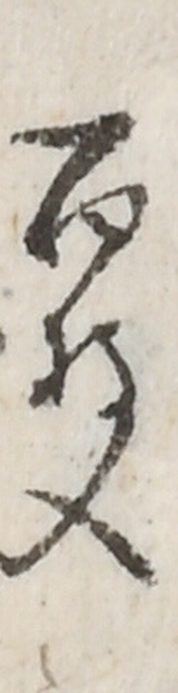百枚入
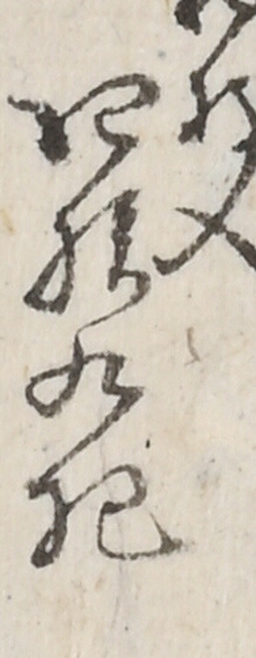四拾九把
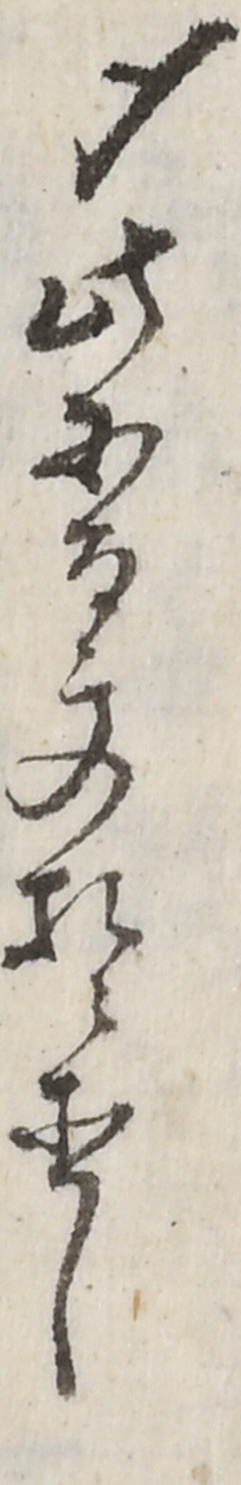〆此五百文札ニ直し
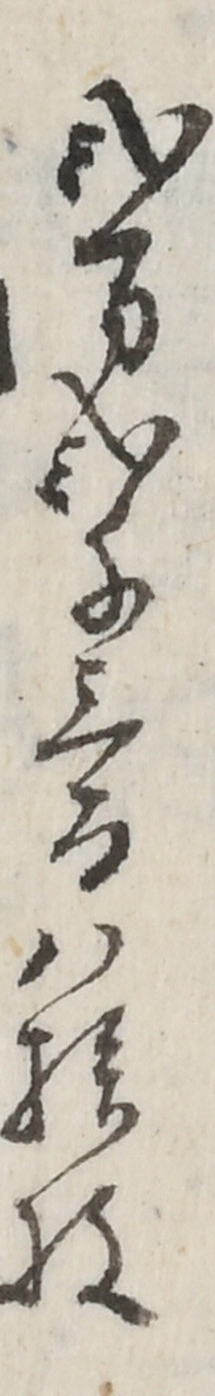弐万弐千三百八拾枚
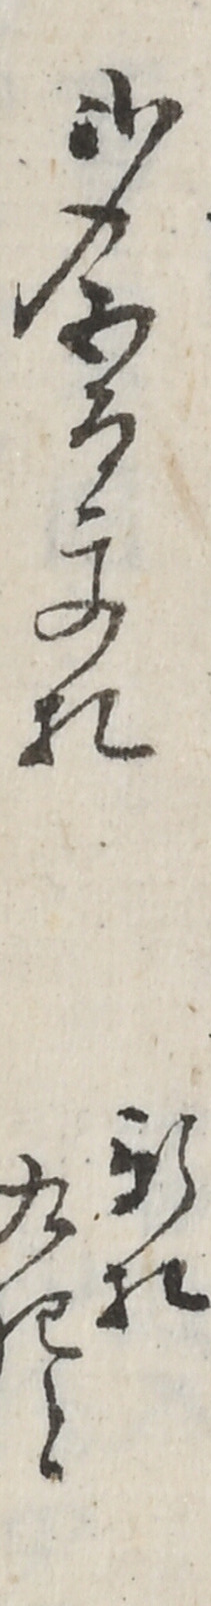一弐貫五百文札新札
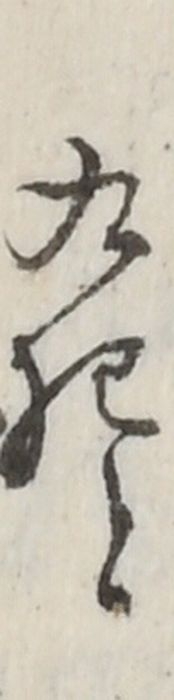九把ニ
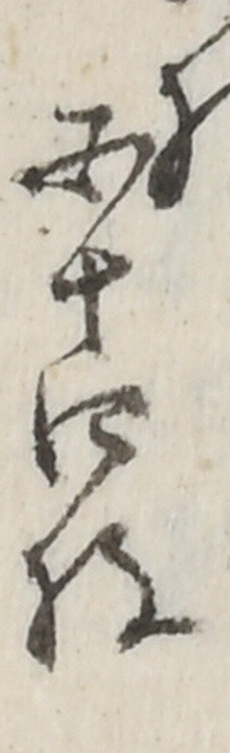五十四枚
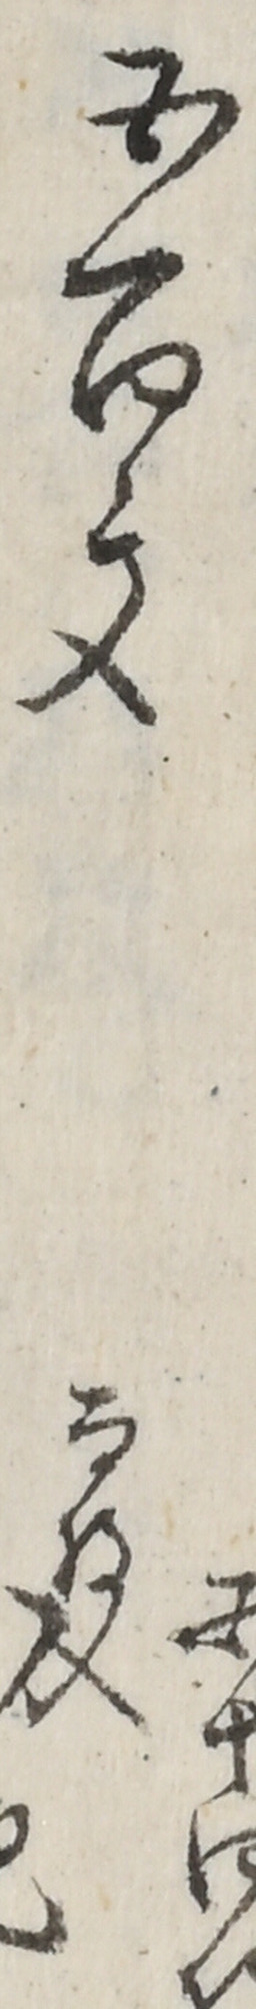五百文百枚入
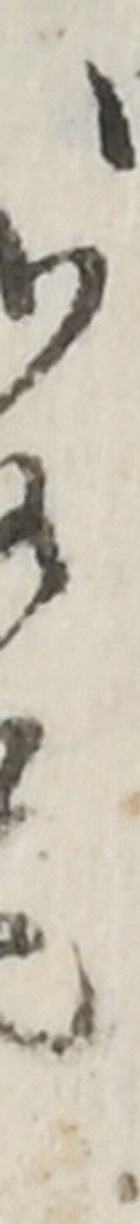弐拾九把

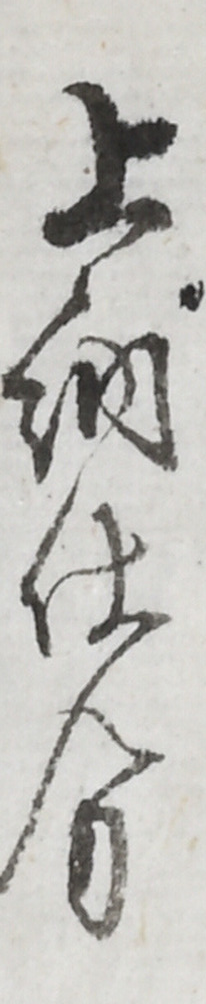上納仕分
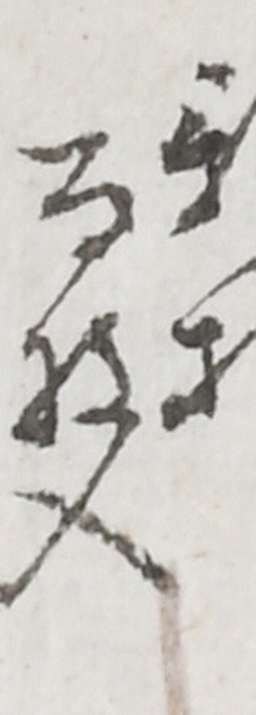百枚入
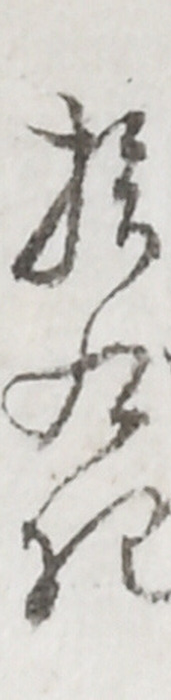拾九把
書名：髙遠限楮幣引換ニ付御下ケ預諸事控
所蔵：伊那市立高遠町図書館・合同会社AMANE
